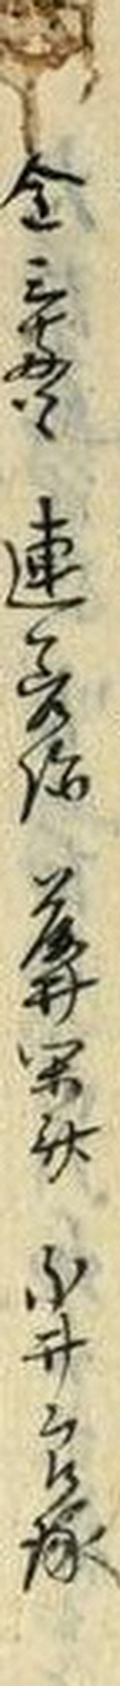金三両ツゝ連善弥藤井関斉永井良琢
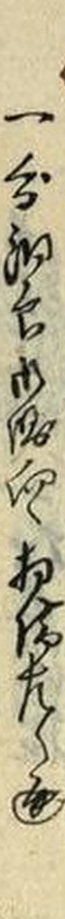一分銅印御側向へ拝借左之通

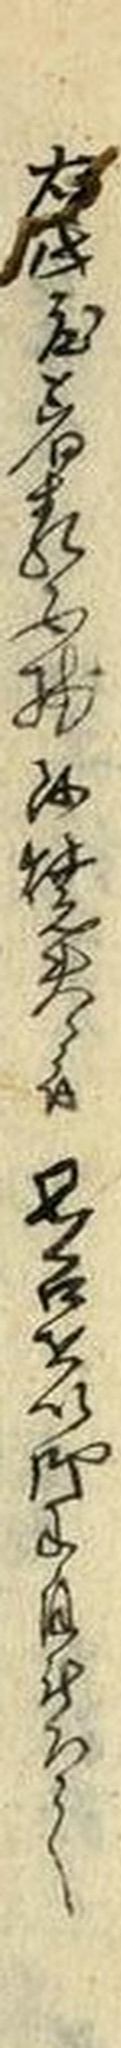右此度着類不残致焼失候ニ付思召を以御手自被下之
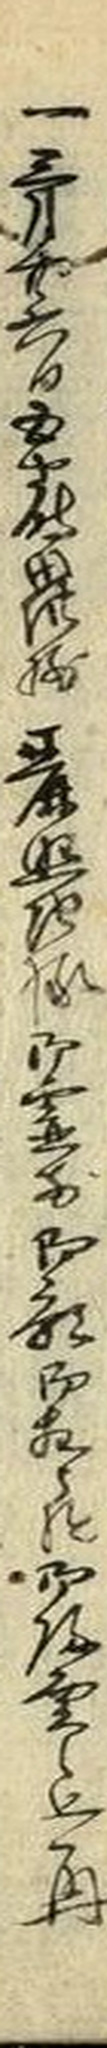三月廿六日五半時御供揃麗照院様御霊前御廟御拝被遊御帰殿之上再
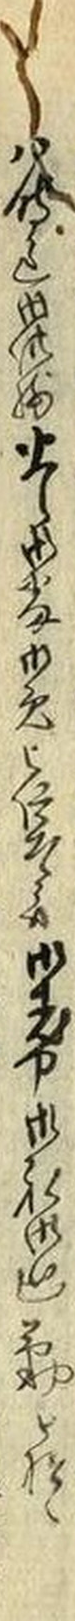八時過御供揃火之御番御免被仰出候ニ付御老中御礼御廻勤被遊候
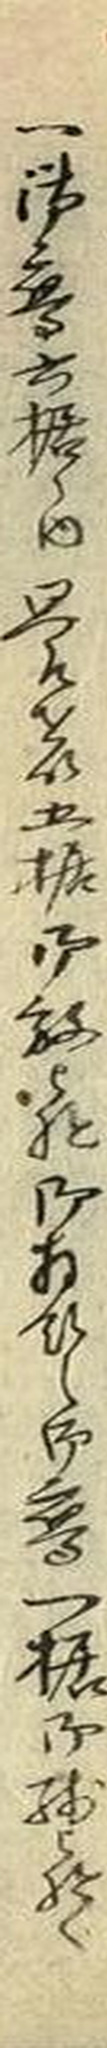一御鷹六据之内思召を以五据御放被遊御拝領之御鷹一据御残被遊候
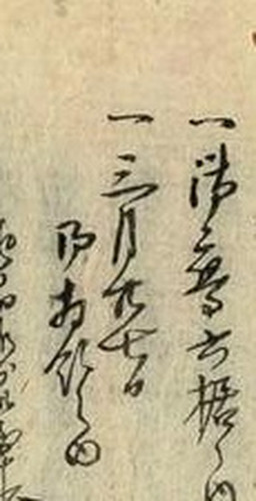一三月廿七日
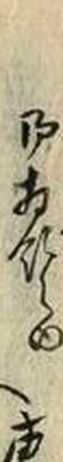御拝領之内
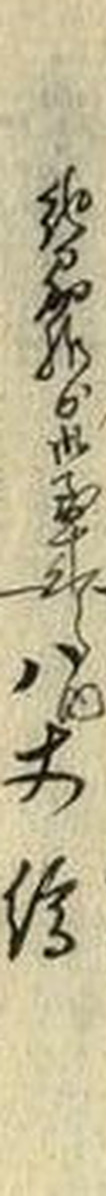紀州様ゟ御到来之内八丈縞一反
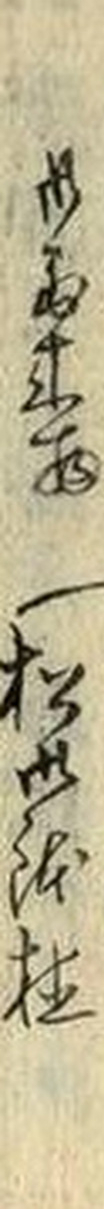御到来物松御鉢植一
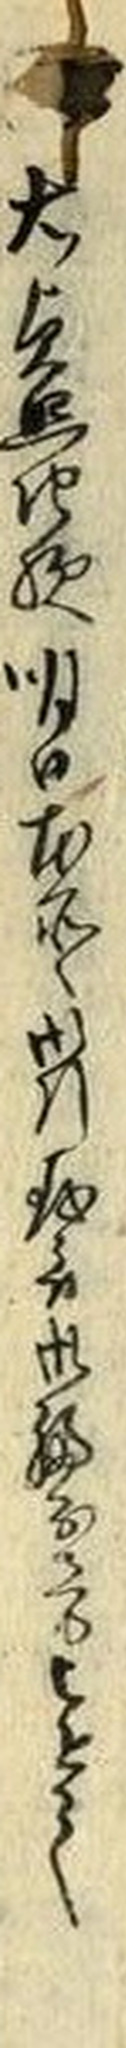右貞照院様へ明日本所へ御引越ニ付御移分之方被進之
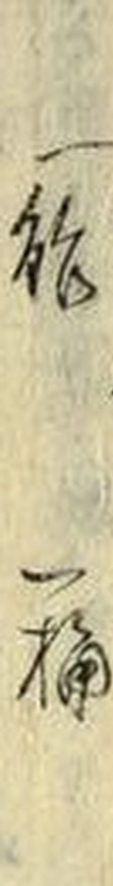鮓一桶
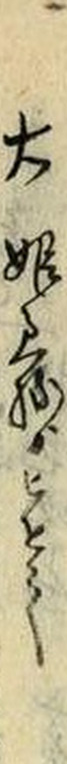右姫君様ゟ被進之
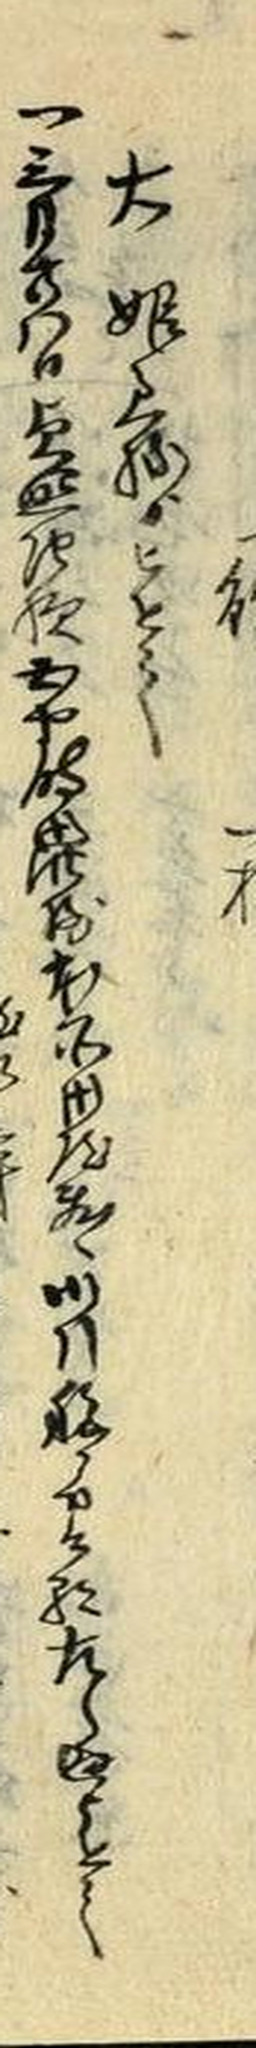一三月廿八日貞照院様五半時御供揃本所御屋敷へ御引越ニ付今般左之通被進之
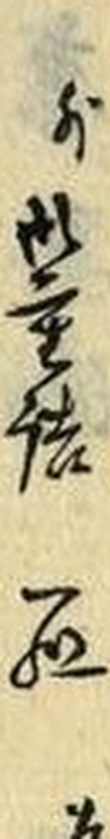御塗重一組
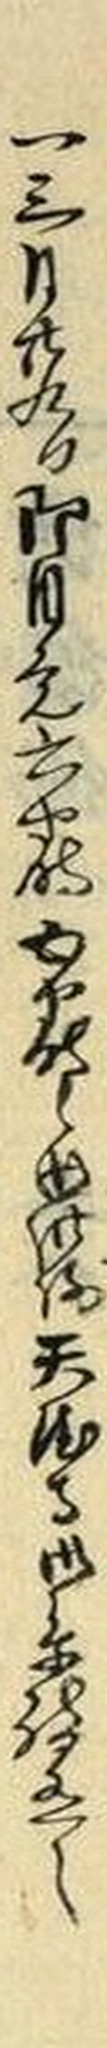一三月廿九日御目覚六半時五半時之御供揃天徳寺御参詣有之
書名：少傅日録抄（斉承付側向頭取日記、在府）
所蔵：福井県文書館 Fukui Prefectural Archives
